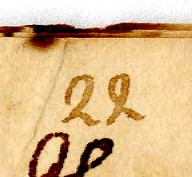22
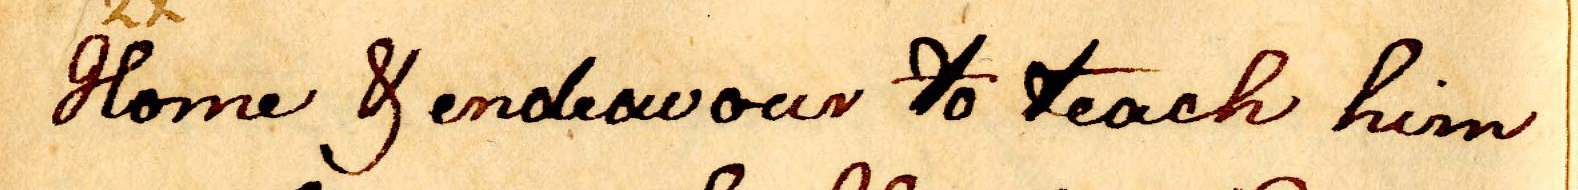Home & endeavour to teach him
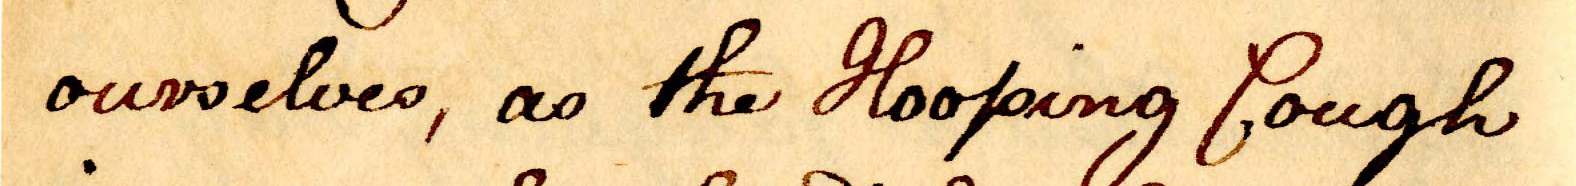ourselves, as the Hooping Cough
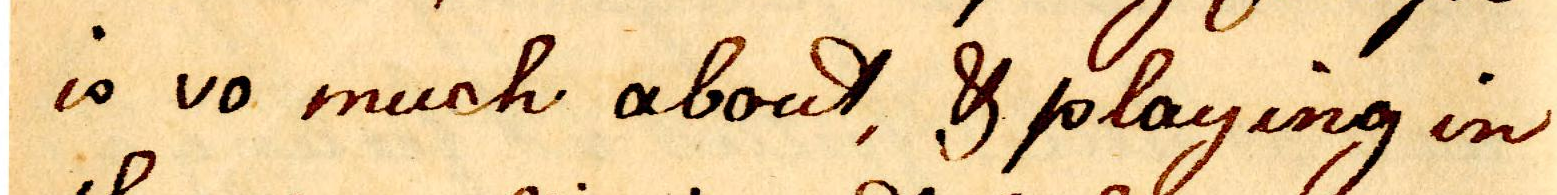is so much about, & playing in
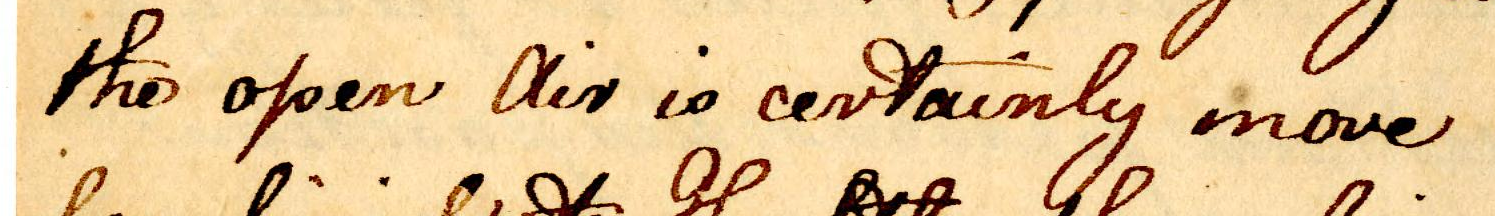the open Air is certainly more
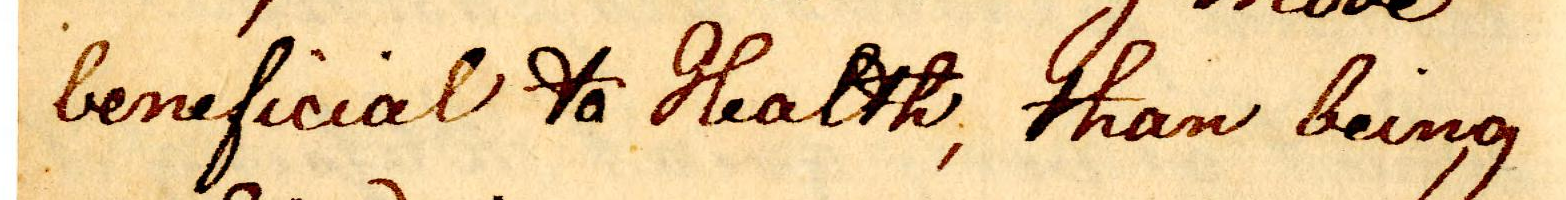beneficial to Health, than being
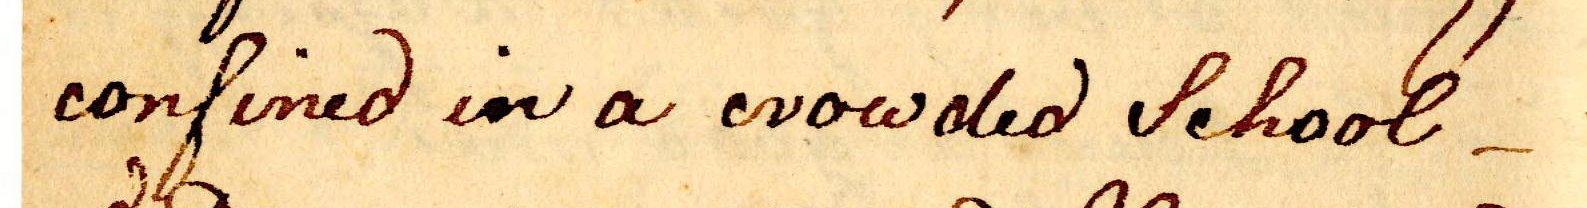confined in a crowded School-
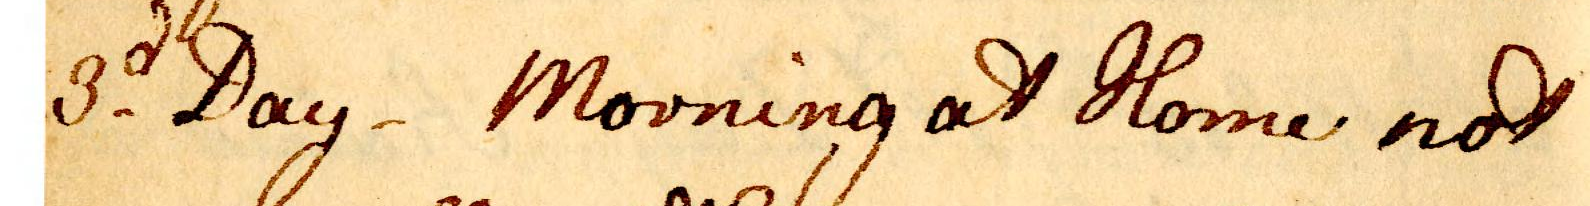3^d. Day- Morning at Home not
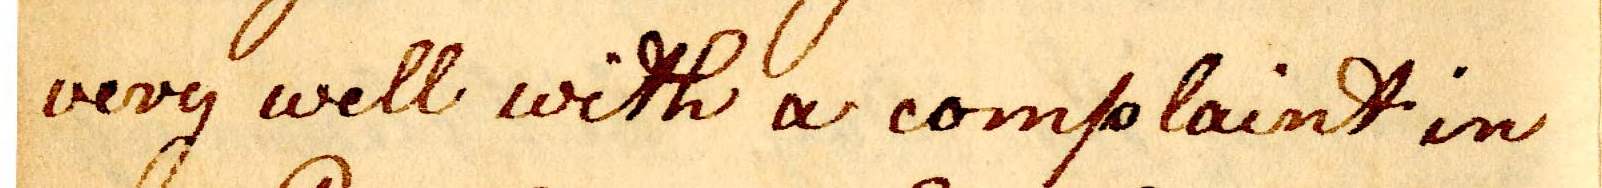very well with a complaint in
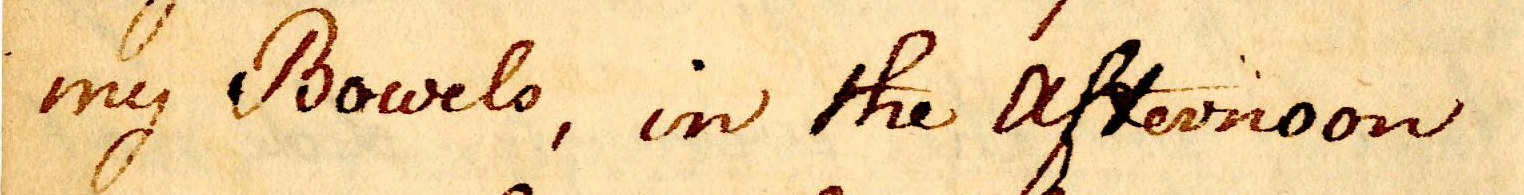my Bowels, in the Afternoon
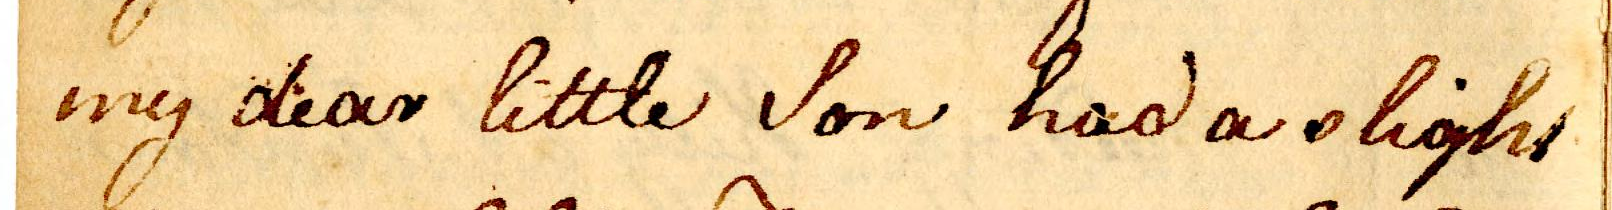my dear little Son had a slight
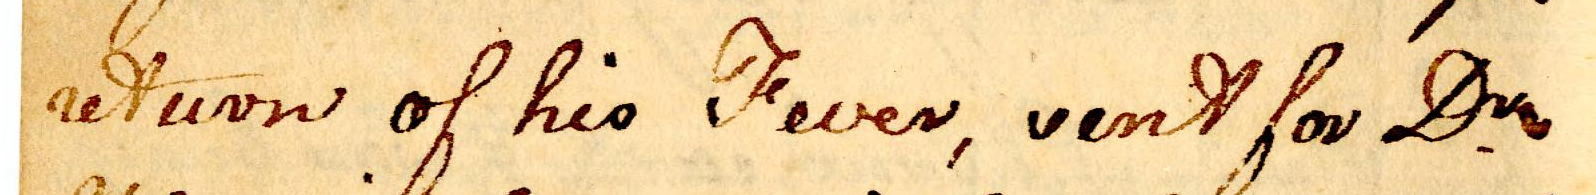return of his Fever, sent for D^r.
